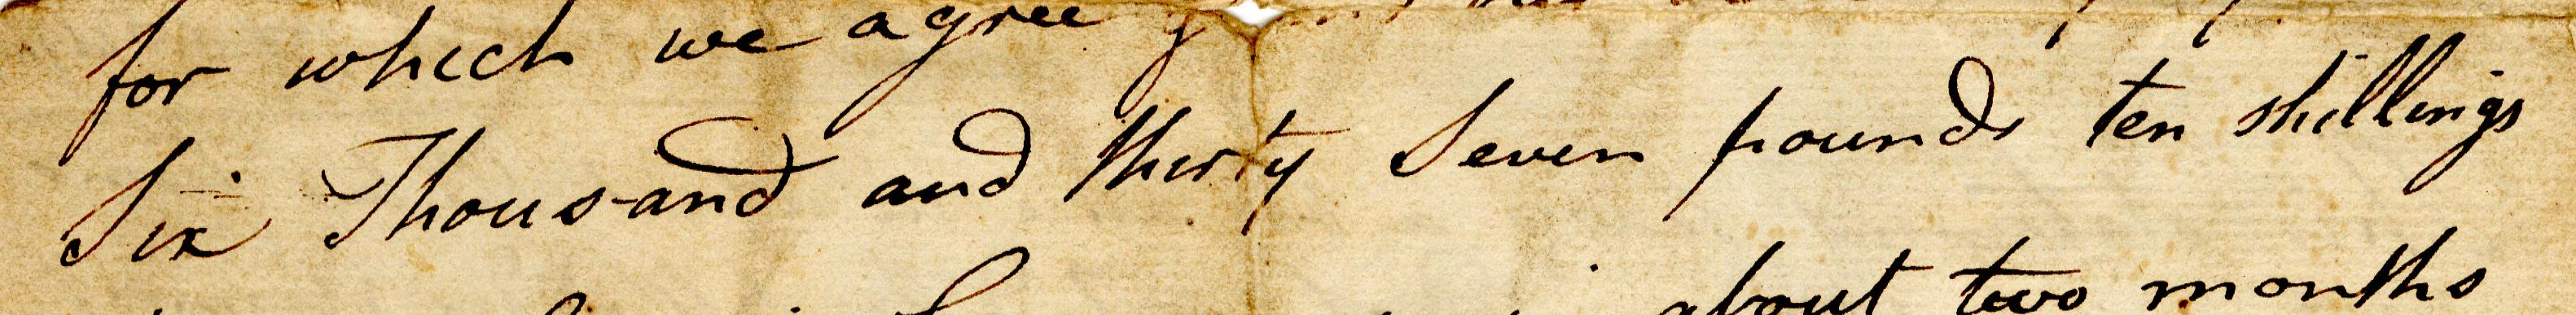Six Thousand and thirty Seven pounds ten shillings
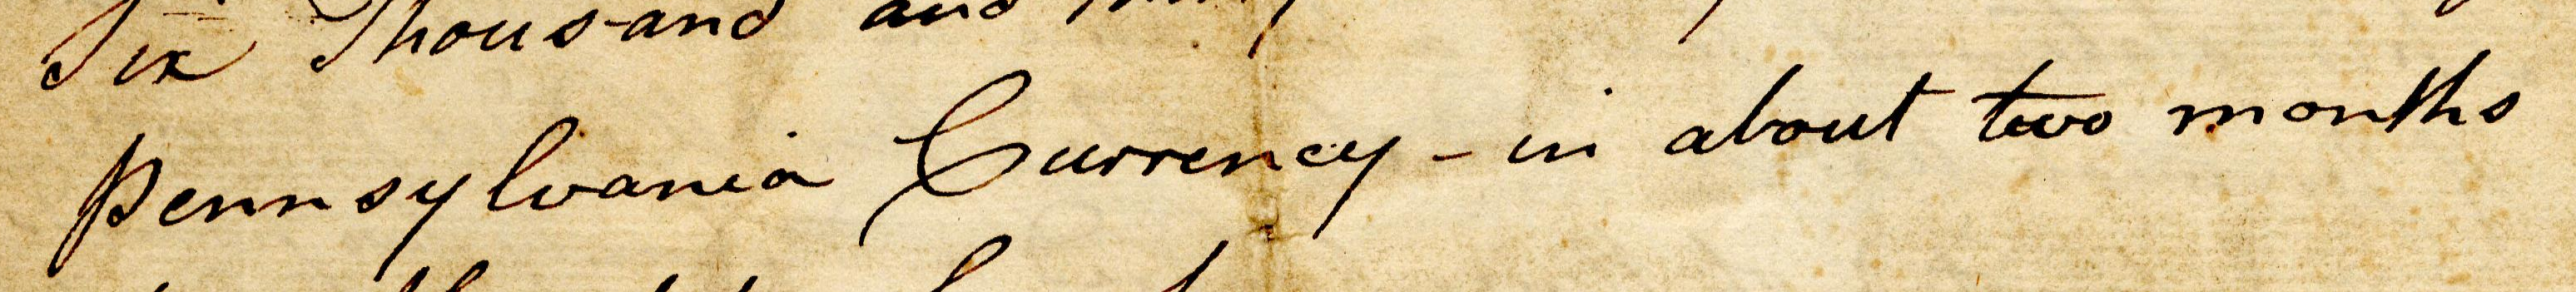Pennsylvania Currency- in about two months
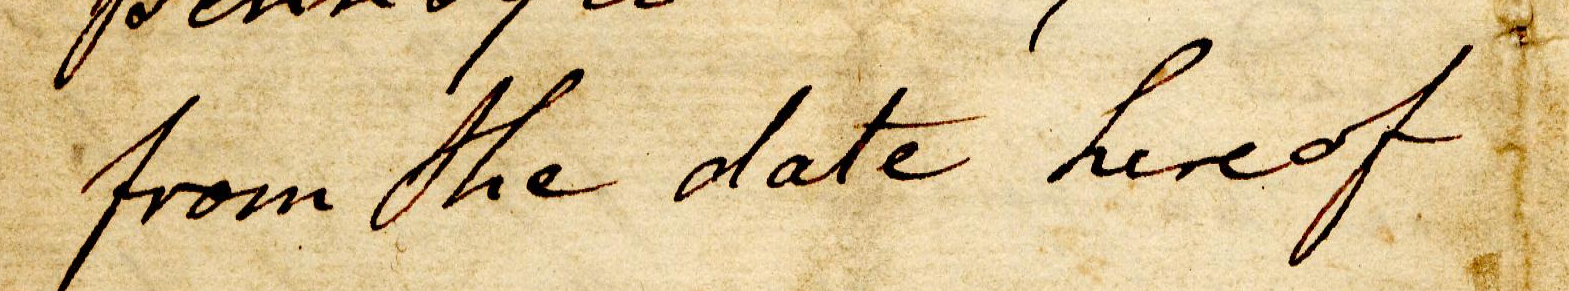from the date hereof
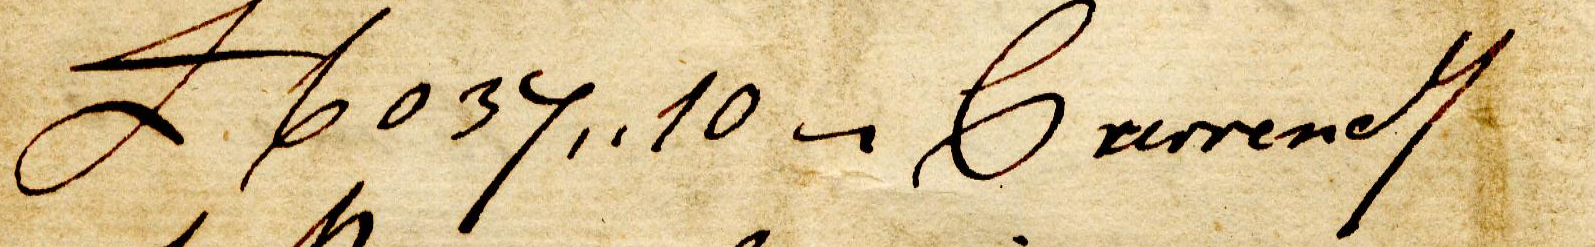£6037..10 Currency
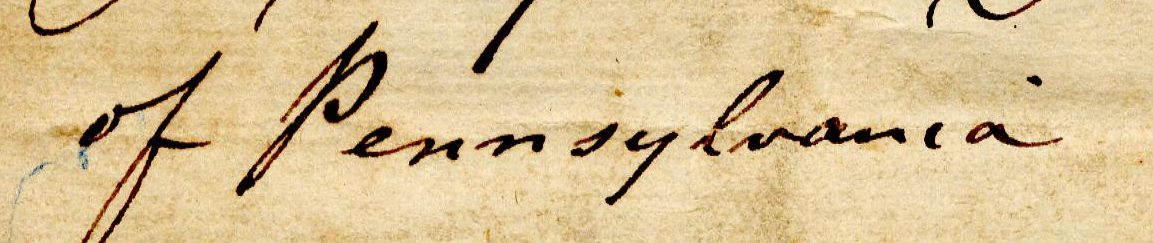of Pennsylvania
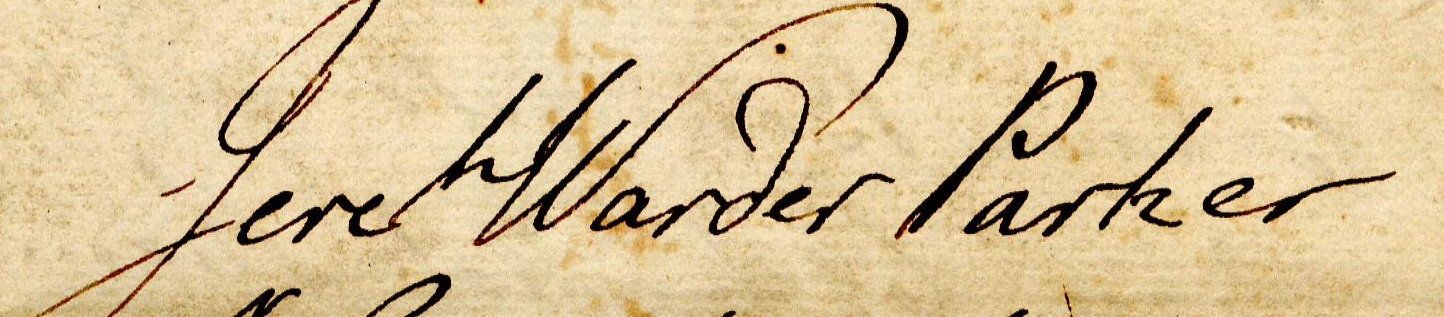Jere^h Warder Parker
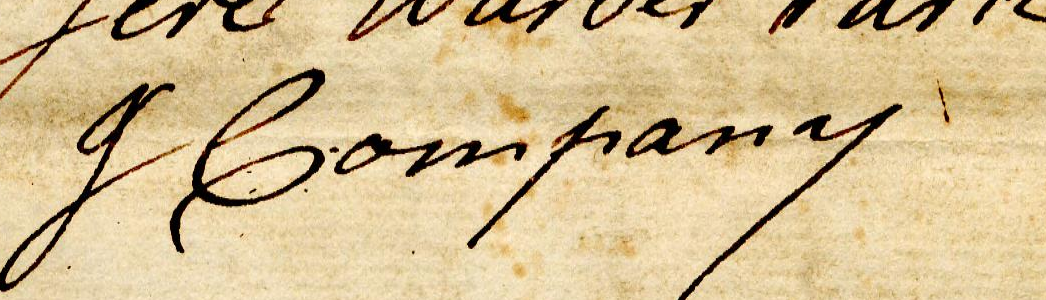& Company
